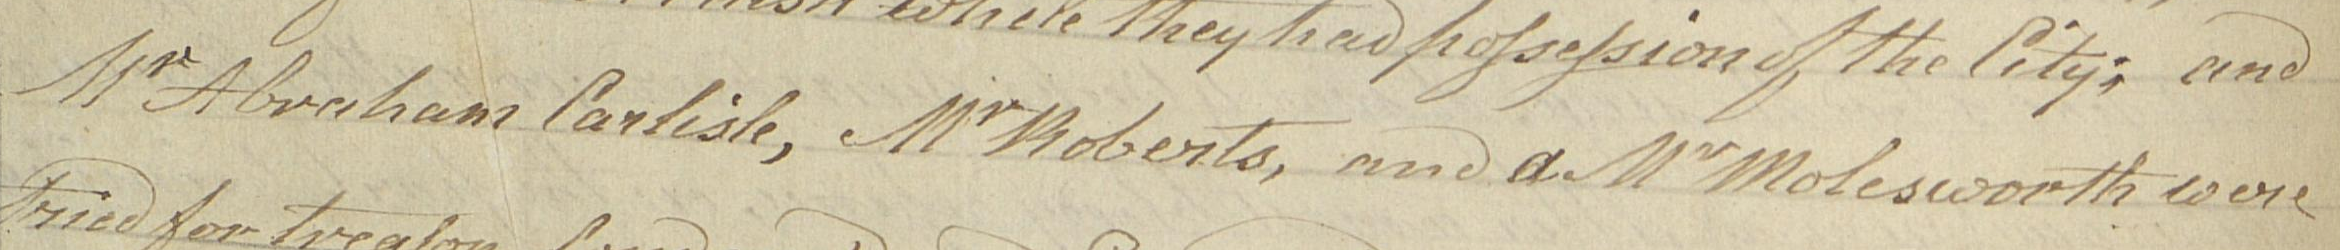M^r Abraham Carlisle, M^r Roberts, and a M^r. Molesworth were
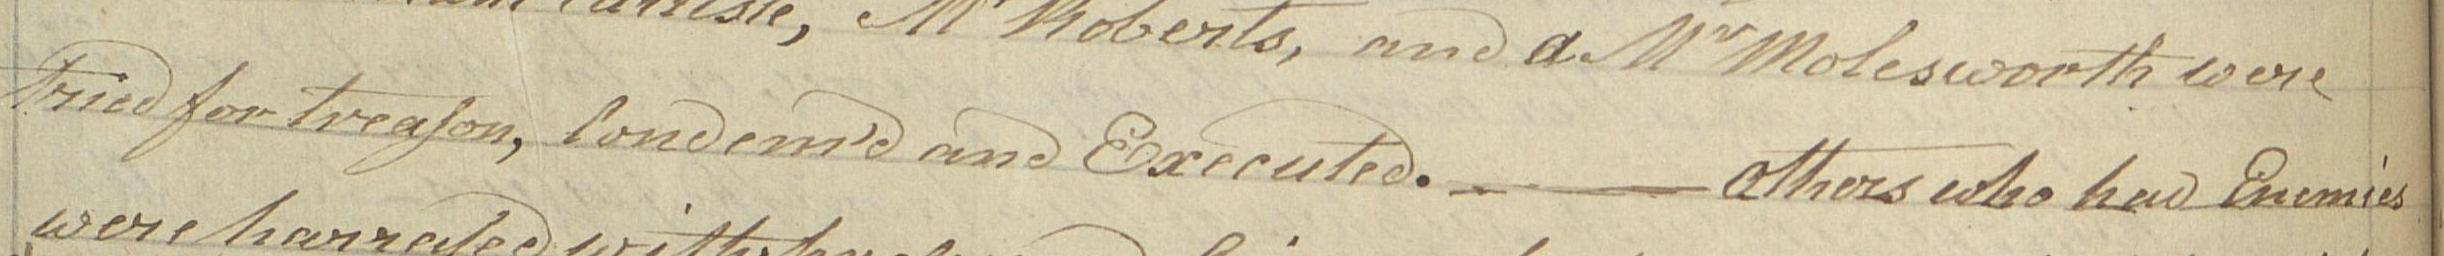tried for treason, Condem'd and Executed. Others who had Enemies
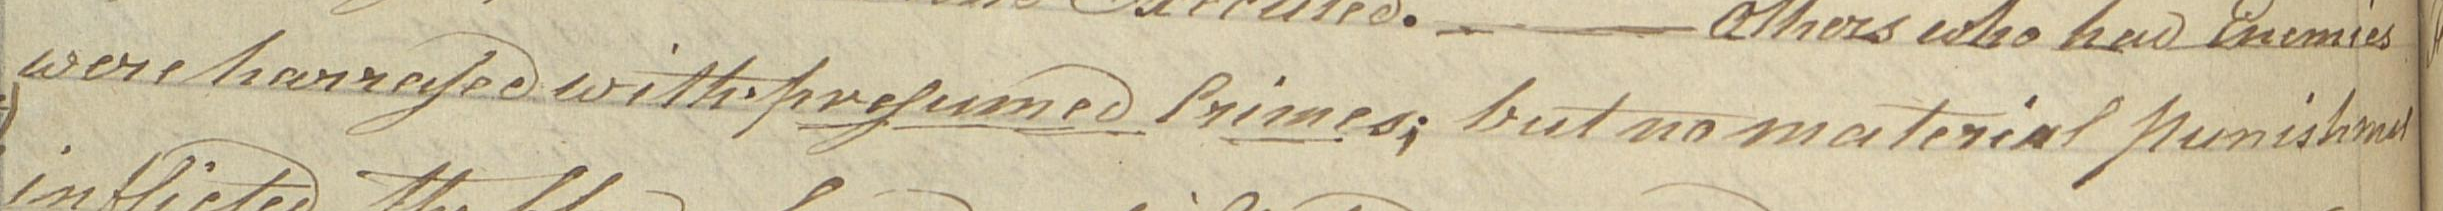were harrased with presumed Crimes; but no material punishment
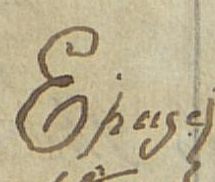E page
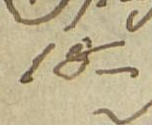18
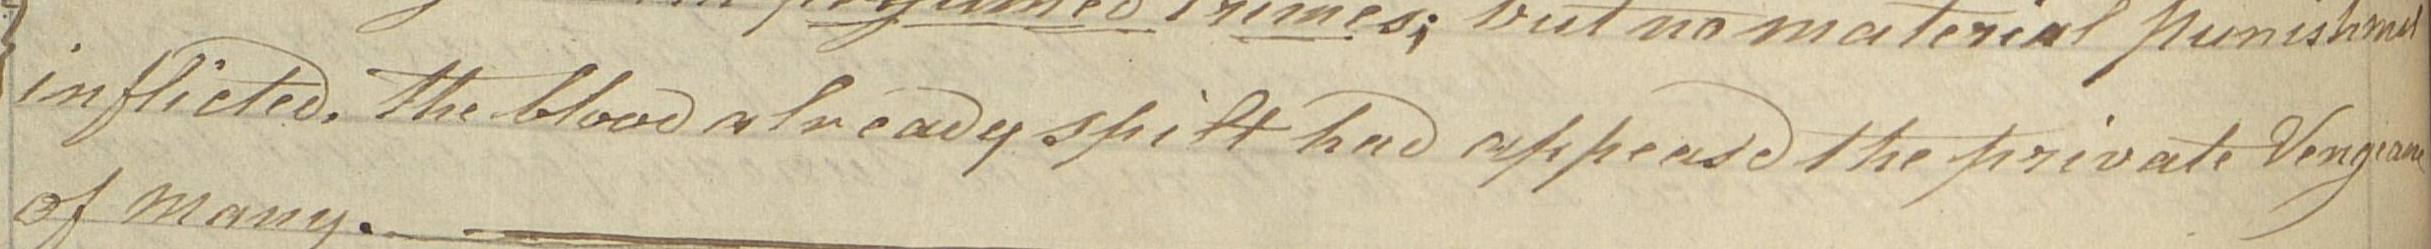inflicted. the blood already spilt had appeasd the private Vengeance
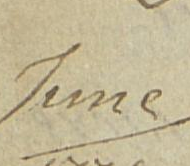June
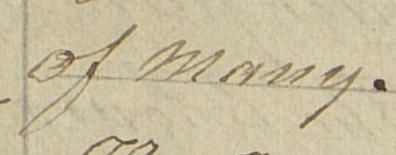of many.
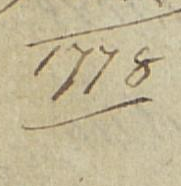1778
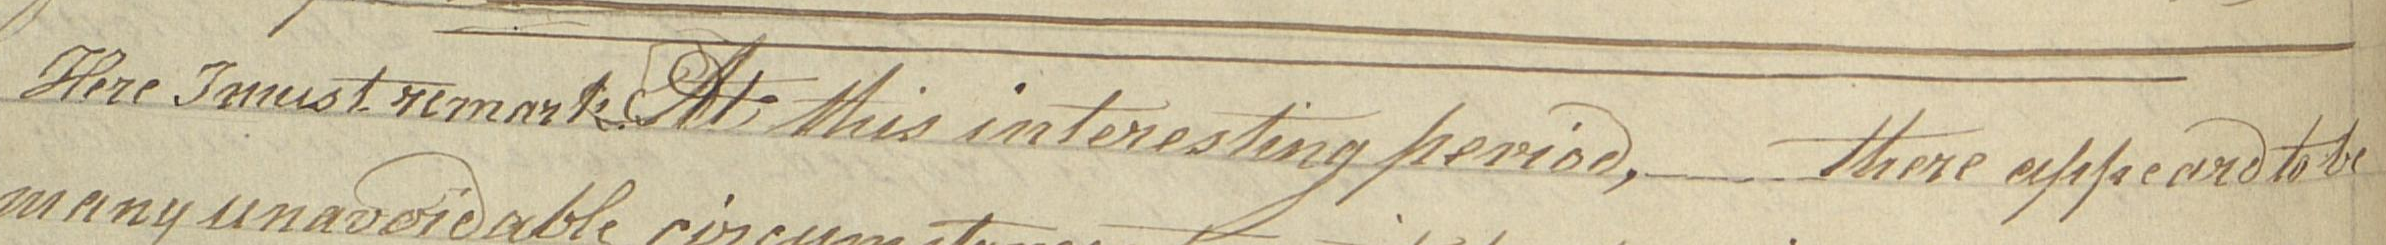Here I must remark At this interesting period, there appeard to be
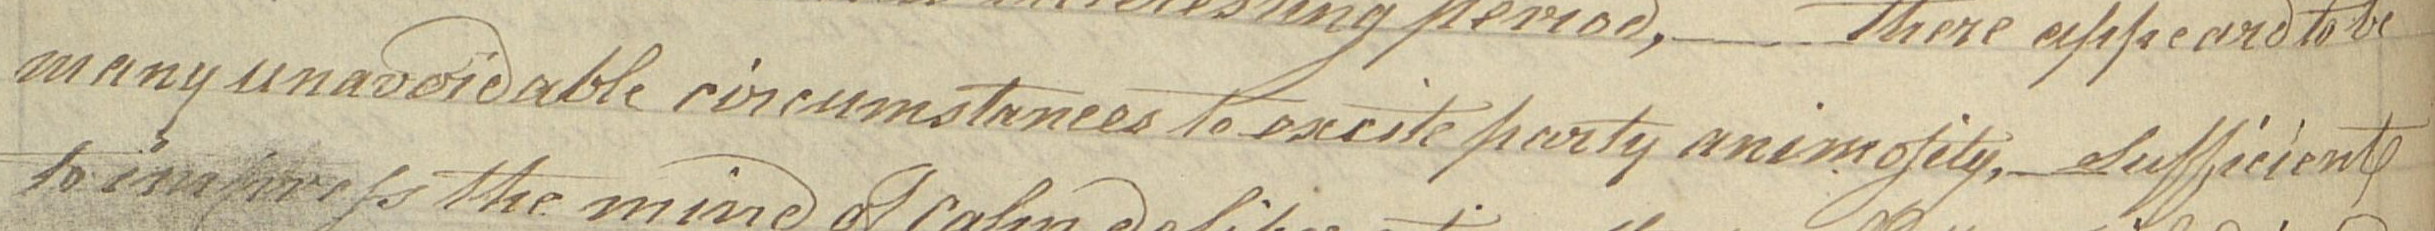many unavoidable circumstances to excite party animosity, Sufficient
